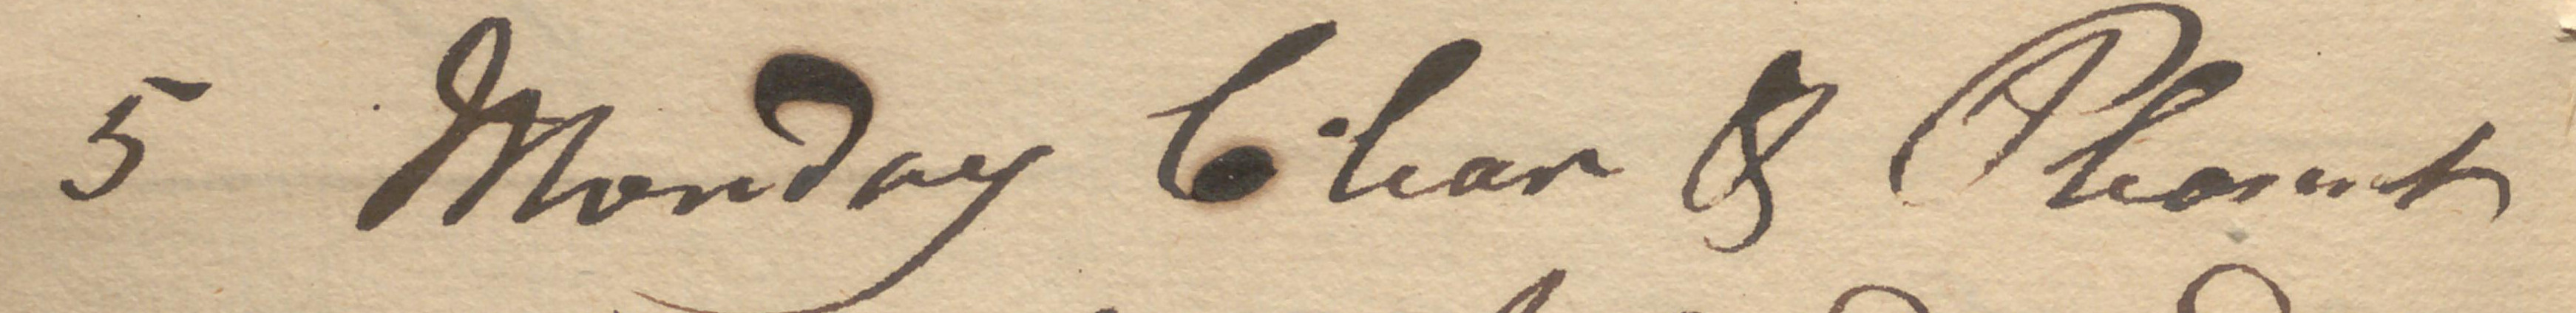5 Monday Clear & Pleasent
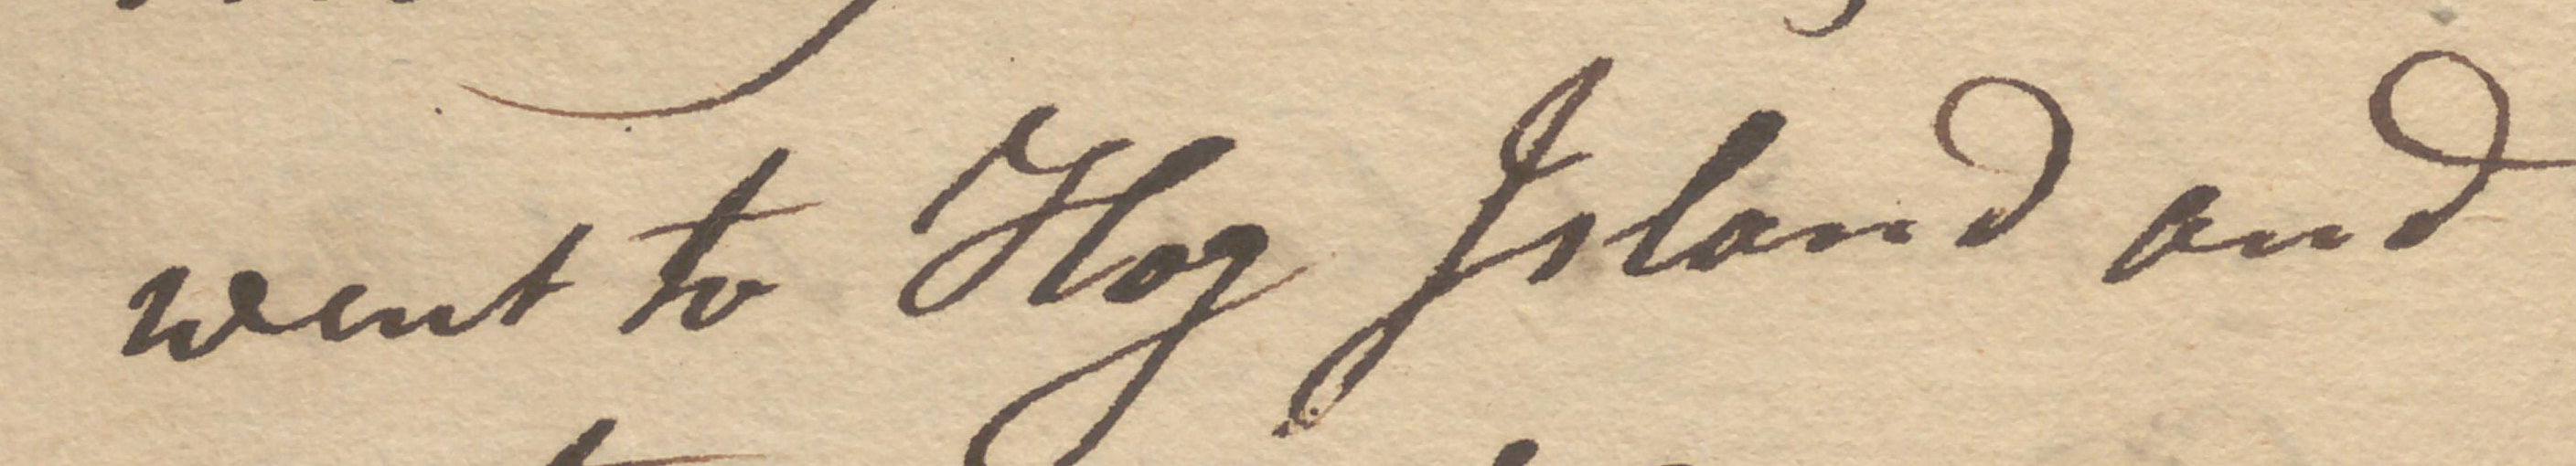went to Hoy Island and
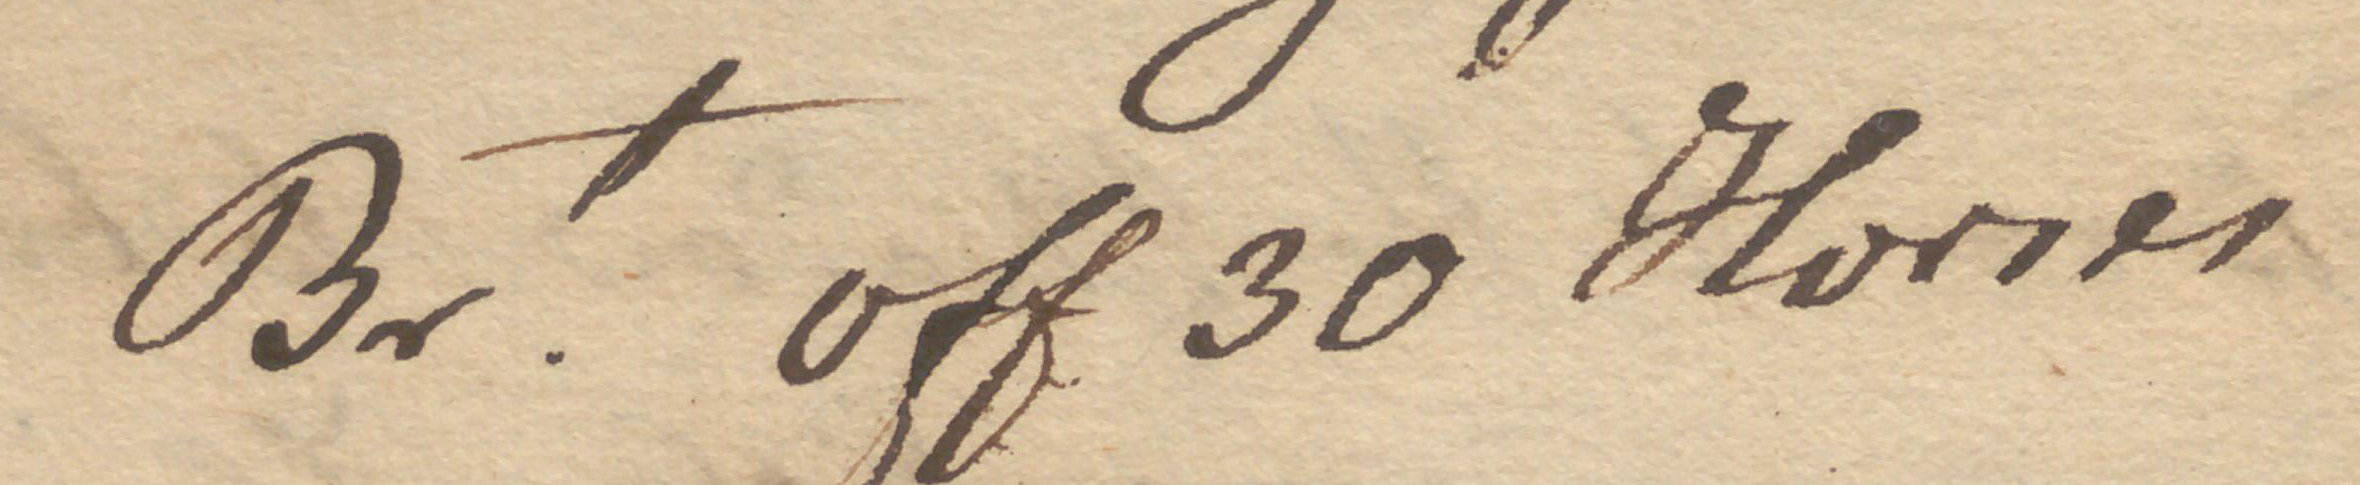Br^t. off 30 Horses
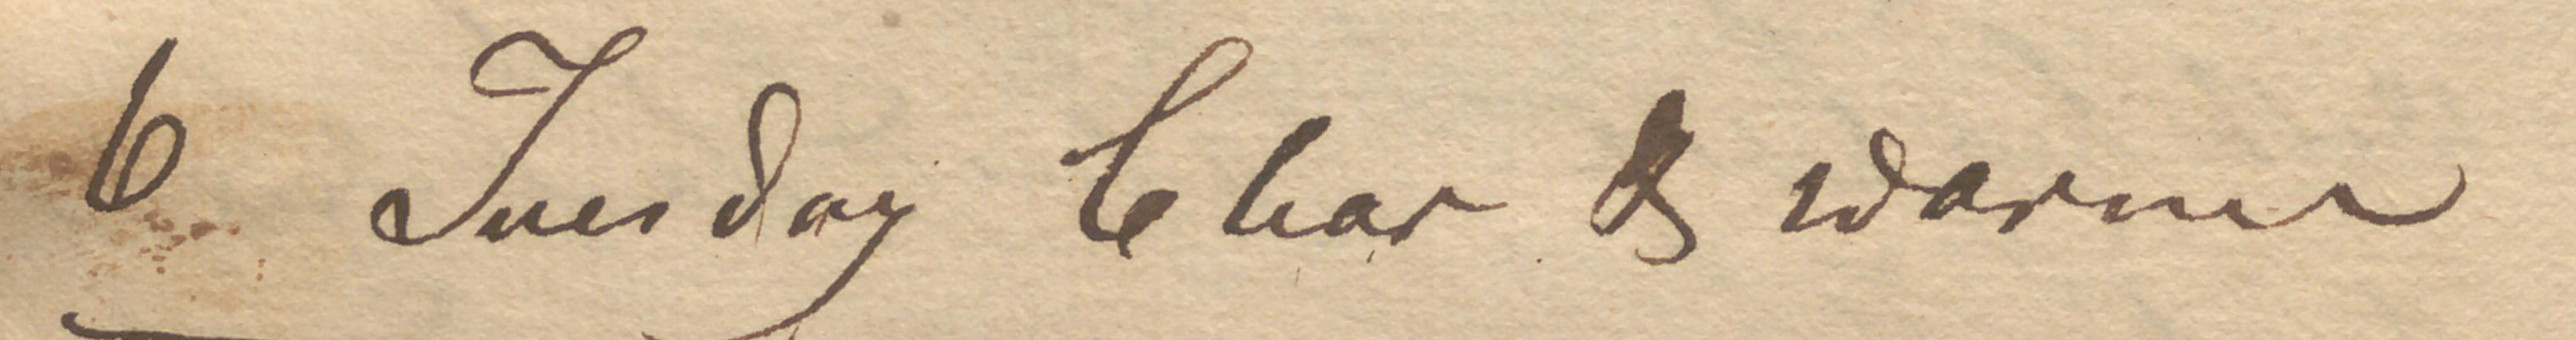6 Tuesday Clear & warme
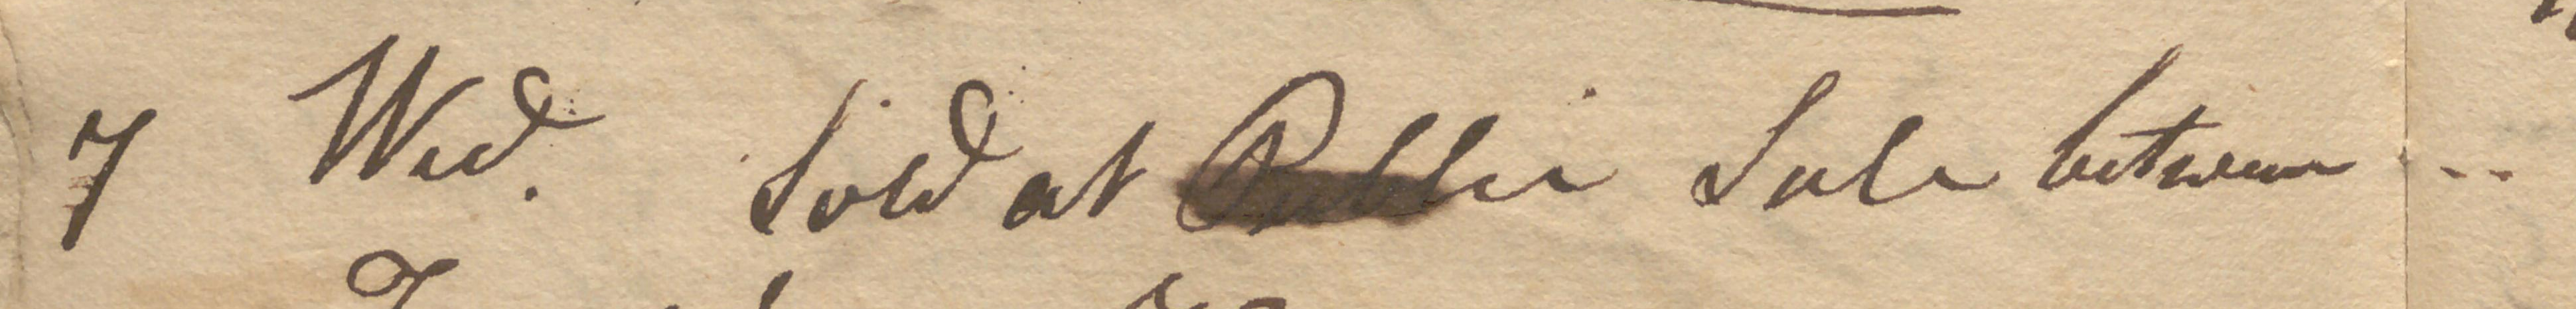7 Wed Sold at Public Sale between
